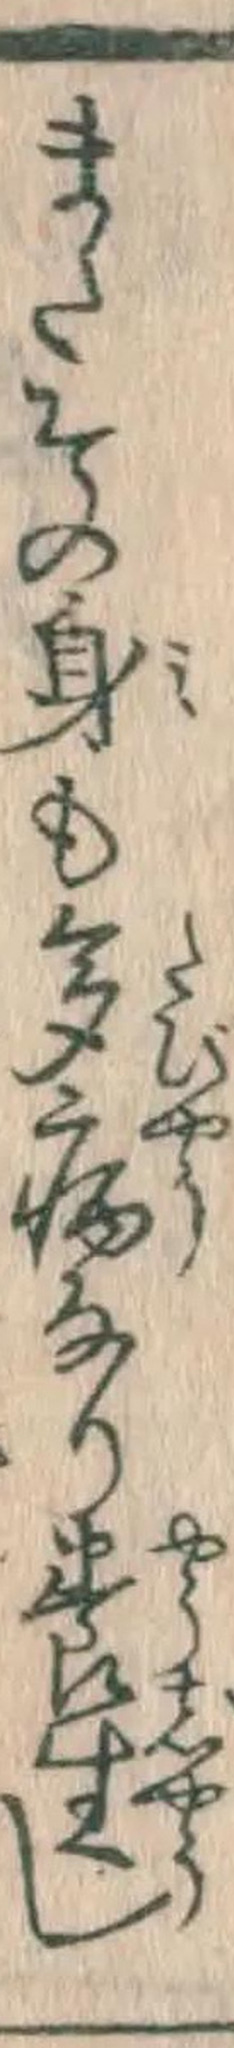またその身も多病なり養生し
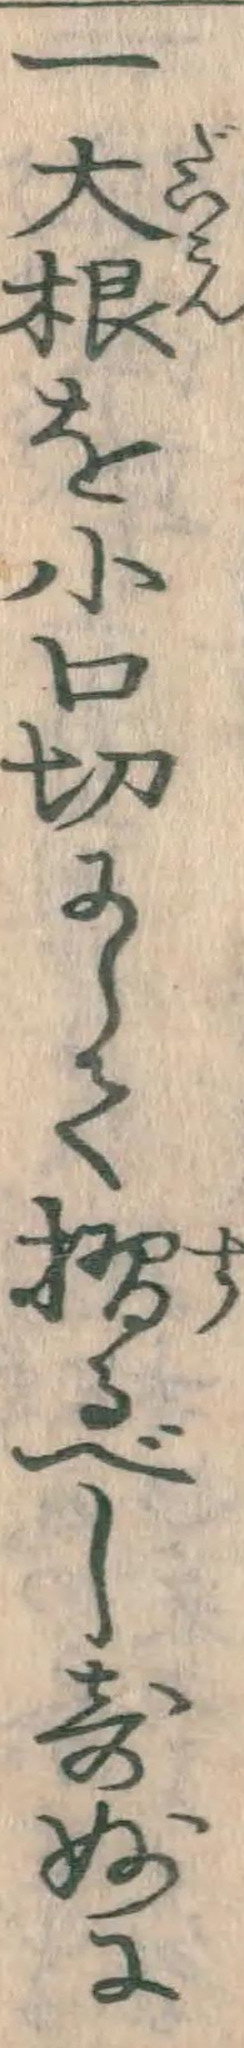一大根を小口切にして摺るべし奇妙に
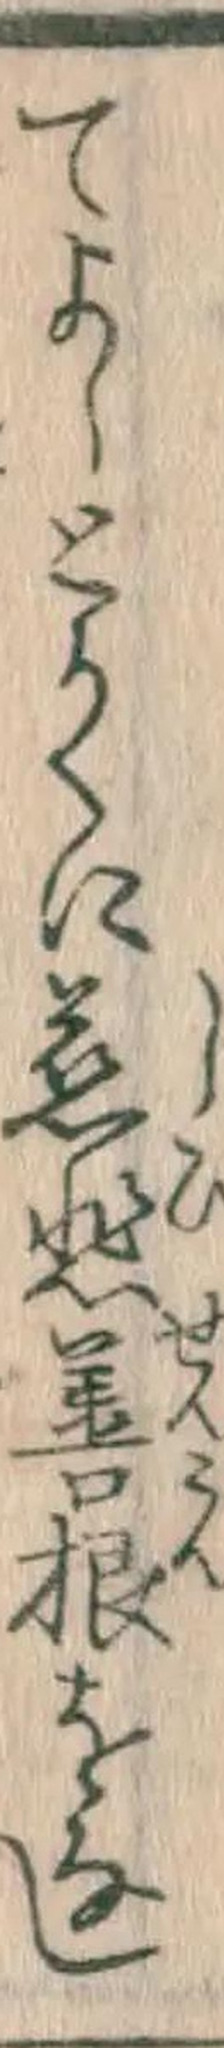てよしとかくに慈悲善根をなし
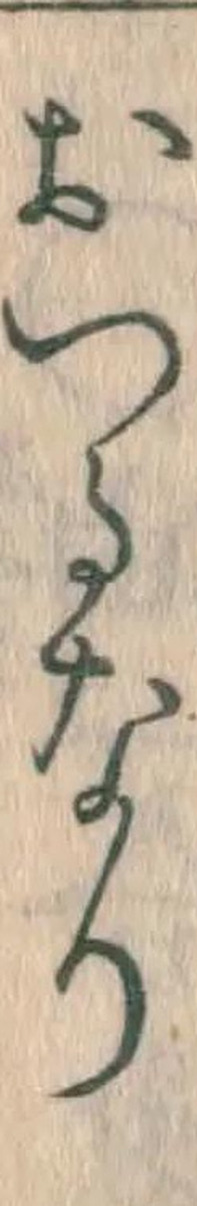おつるなり
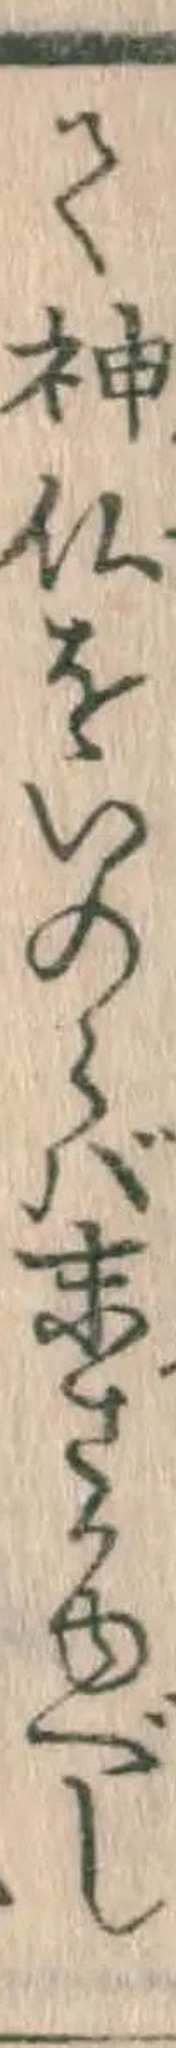て神仏をいのらば末さかゆべし
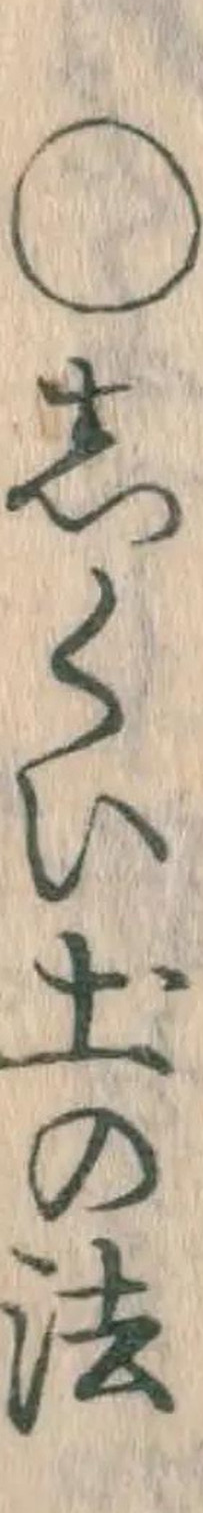○しくい土の法
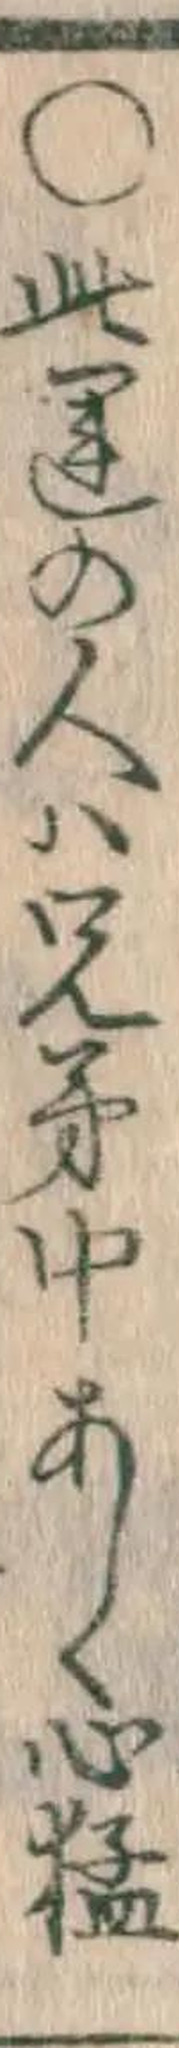○此運の人は兄弟中あしく心猛
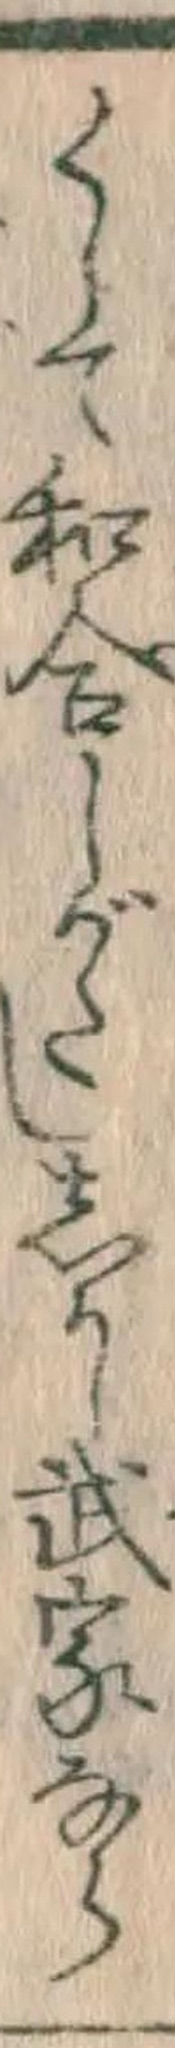くして和合しがたししかし武家なら
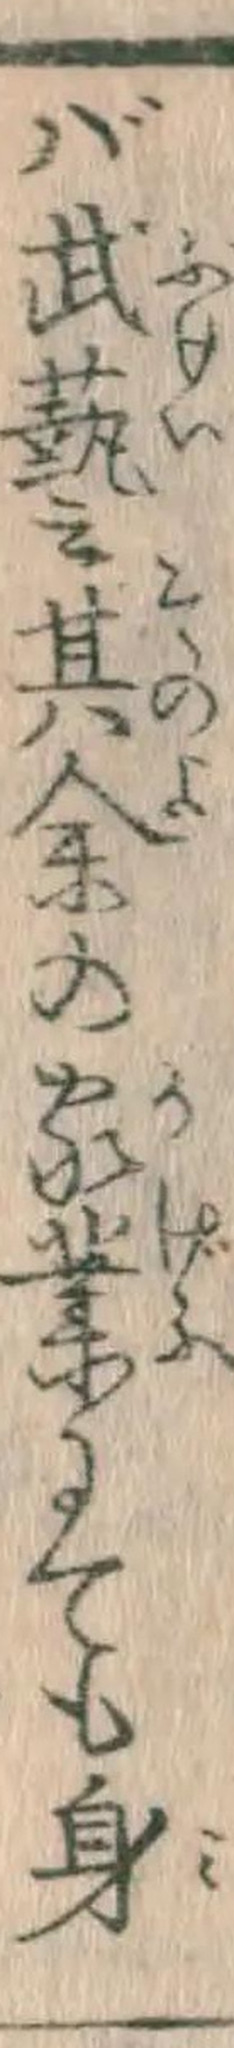ば武芸其余の家業にても身
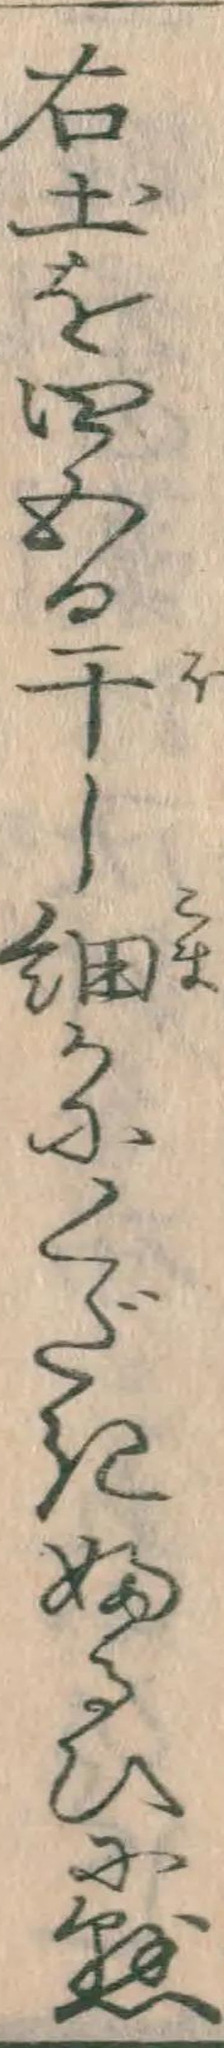右土を四五日干し細かにくだきふるひに懸
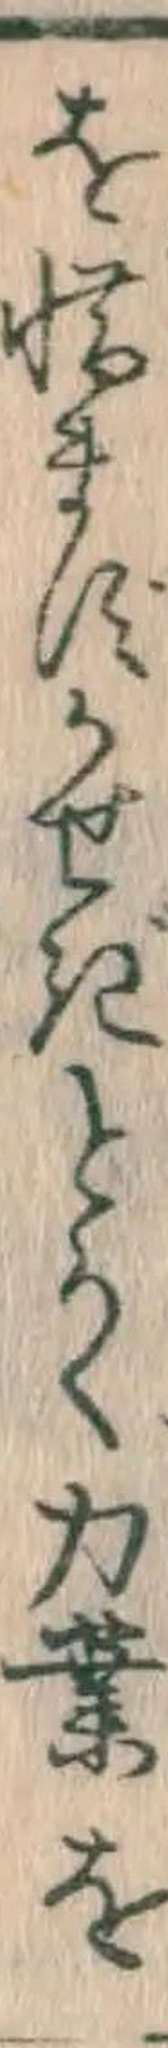を惜まずかせぎとかく力業を
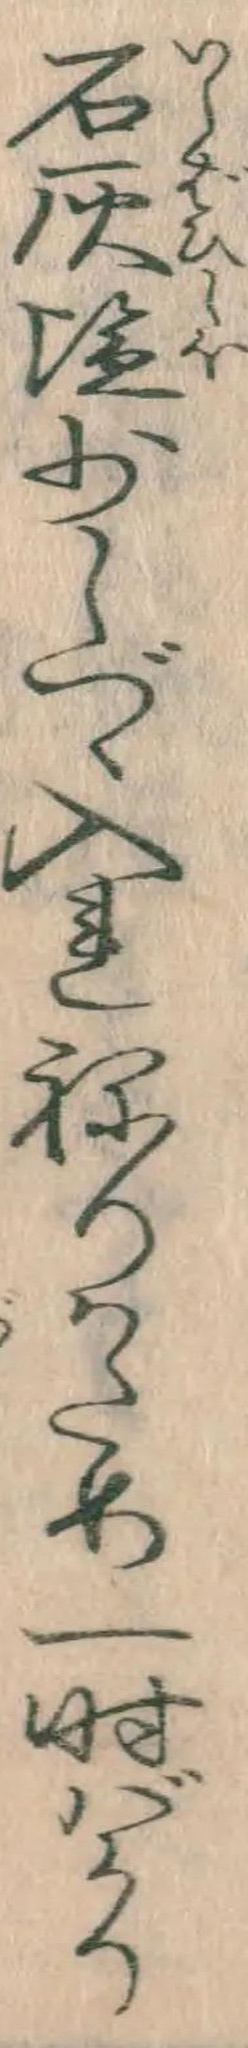石灰塩少しづゝ入れねりかため一時ばかり
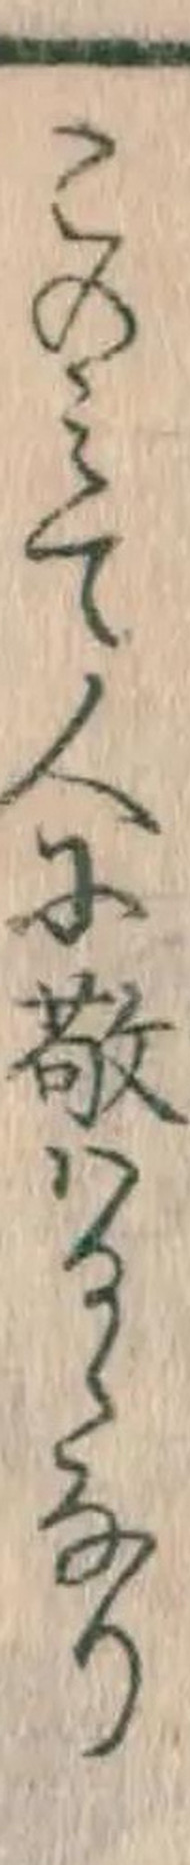このみて人に敬はるゝなり
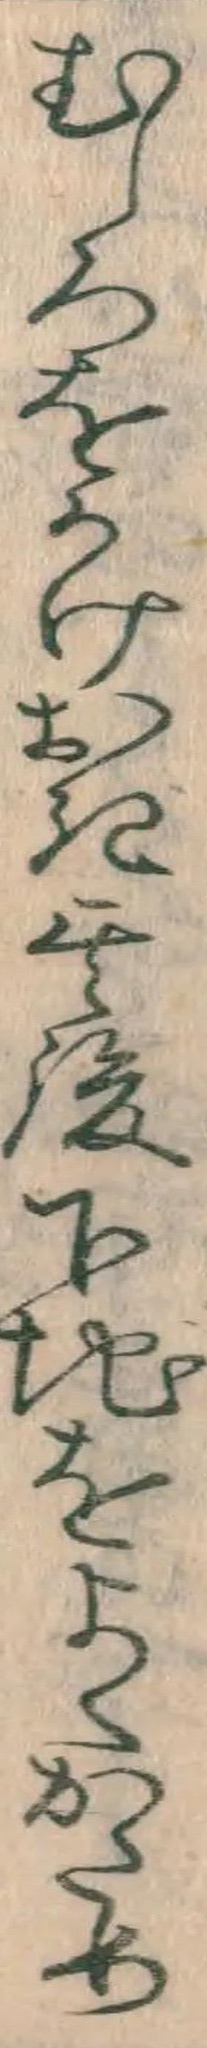むしろをかけおき其後下地をよくかため
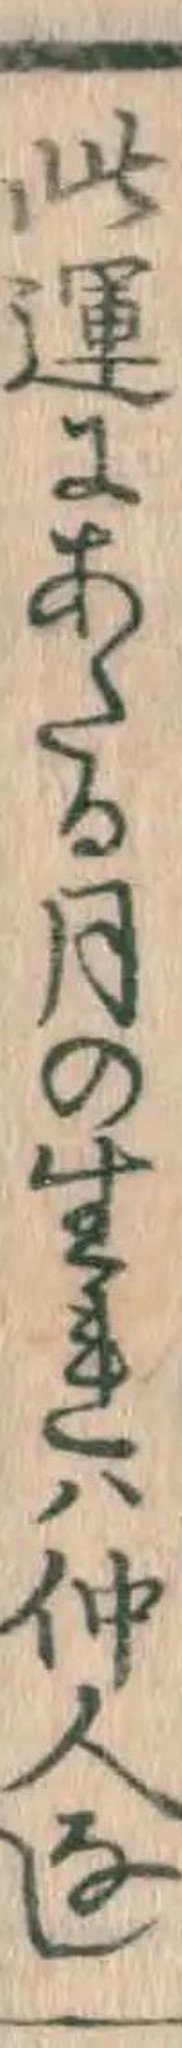此運にあたる月の生れは仲人なし
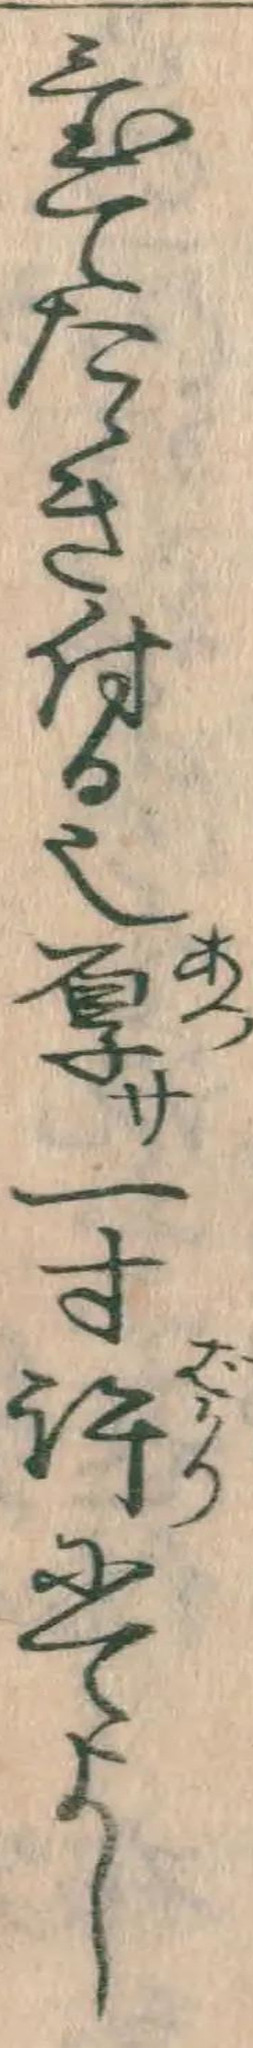置てたゝき付る也厚一寸許にてよし
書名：広益秘事大全 3巻. [2]
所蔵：国立国会図書館 National Diet Library, JAPAN
